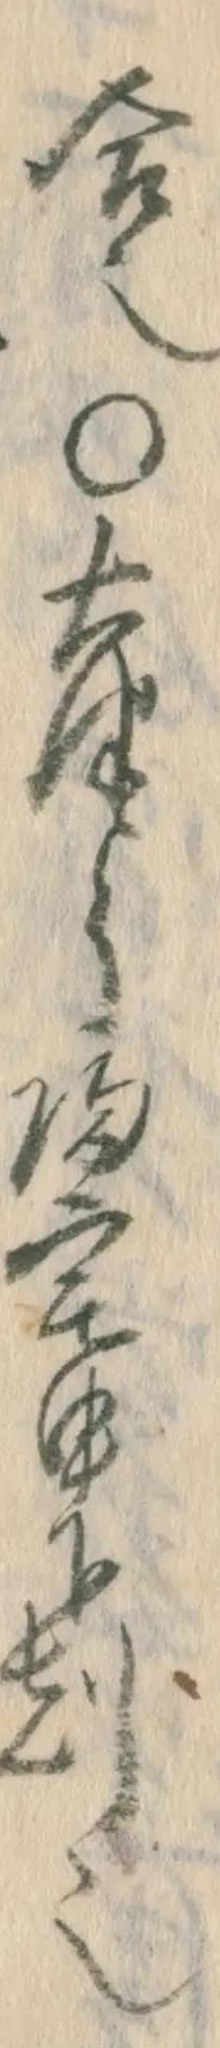合也○大津より帰宅申下刻也
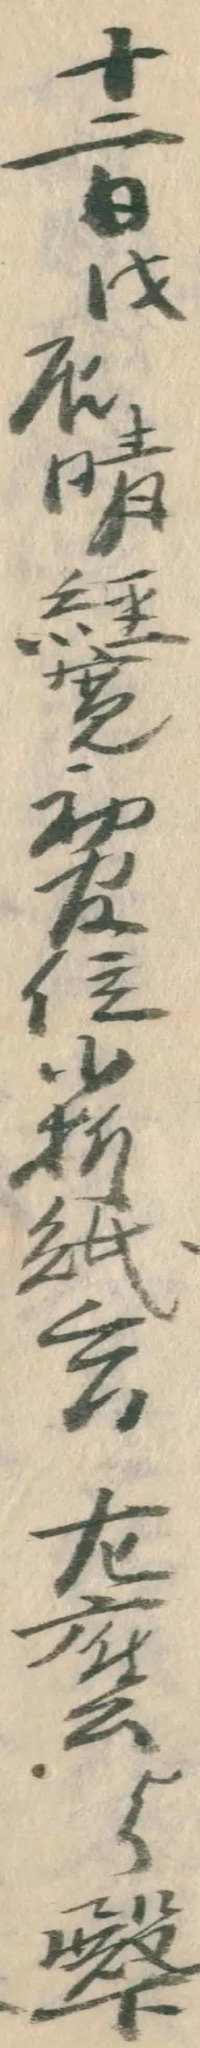十二日戊戌晴経寛初官位小折紙今日左府公より殿下
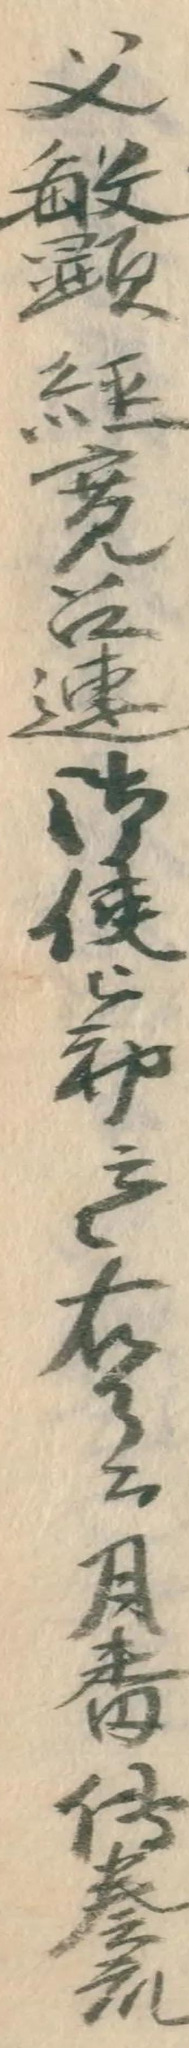父敏顕経寛召連御使被勤云々右了而月番傳奏衆

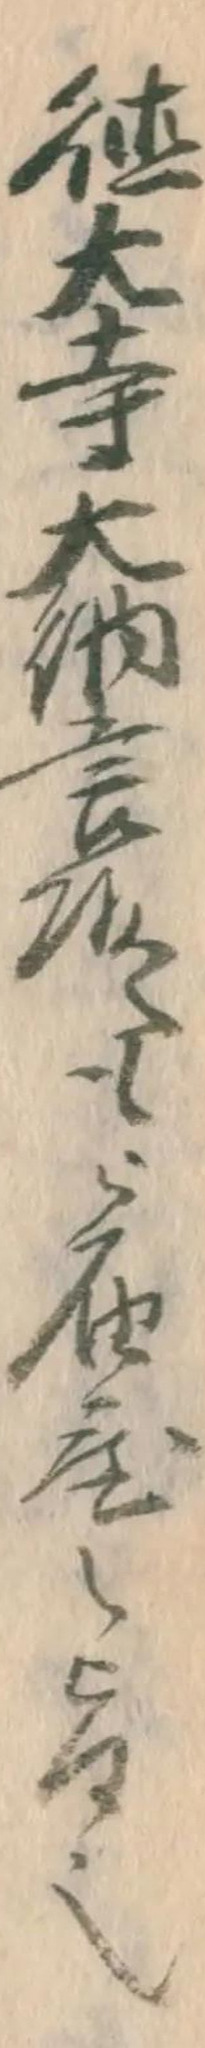徳大寺大納言殿へも被届置候旨也
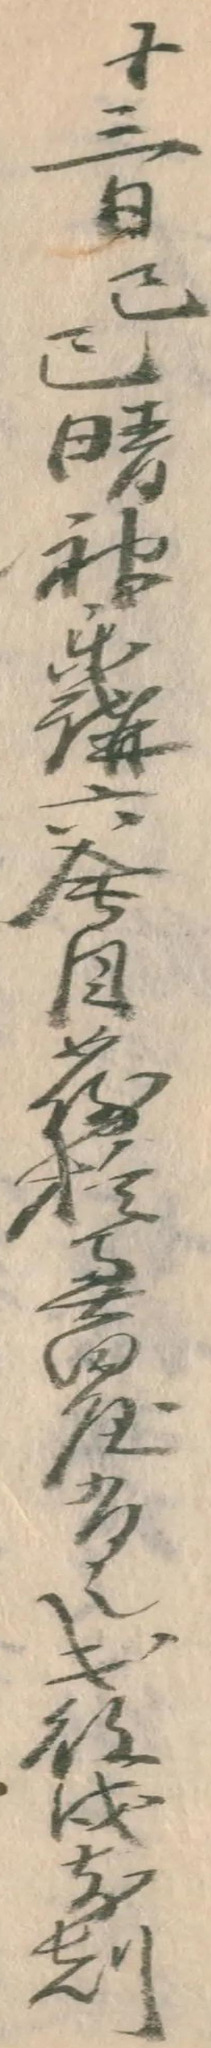十三日己巳晴神楽講六會目如例於奥田屋有之出役戌前刻
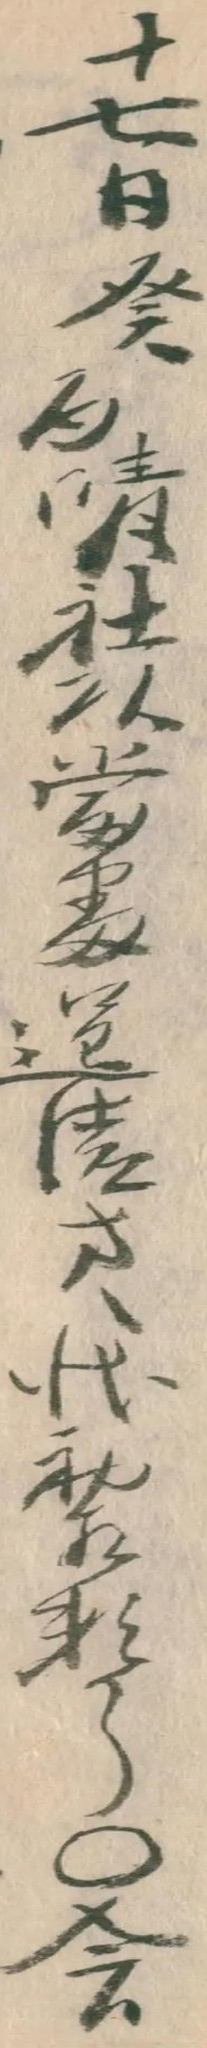十七日癸卯晴社頭當番逞清方へ代勤相頼了○今日
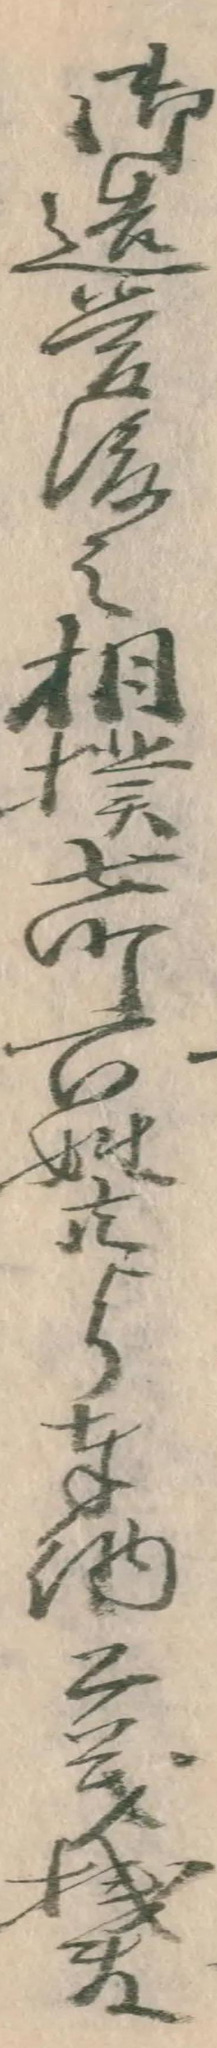御造営後之相撲七町百姓共より奉納公義桟敷
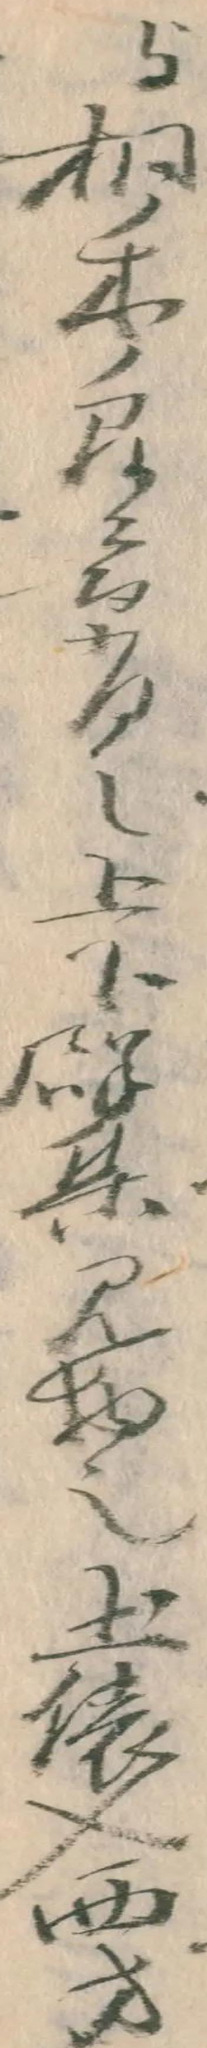与相ノ木ノ間ニ而有之上下群集見物也土俵入西方
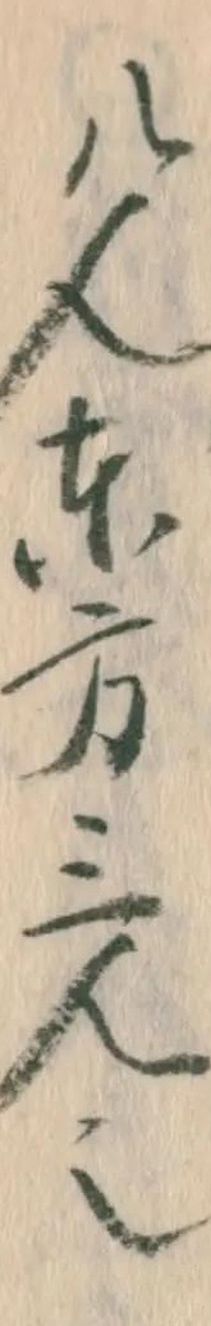八人東方三人也
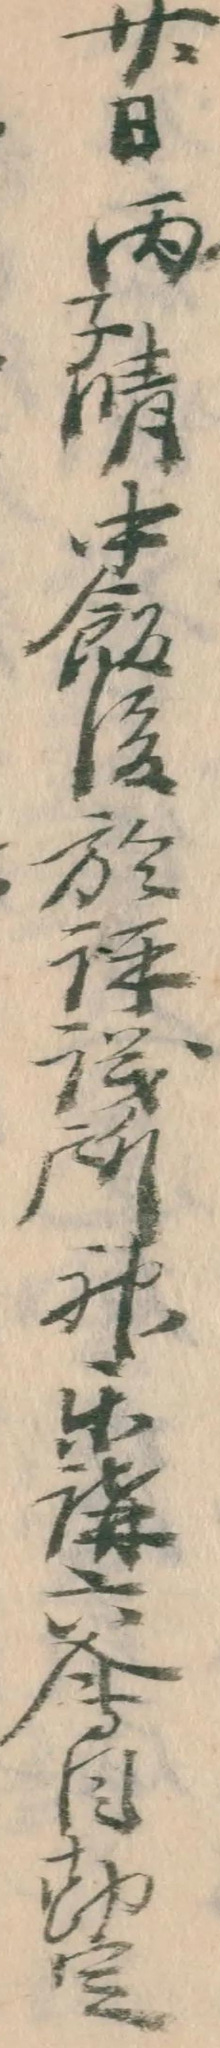廿日丙子晴中飯後於評議所神楽講六會目勘定
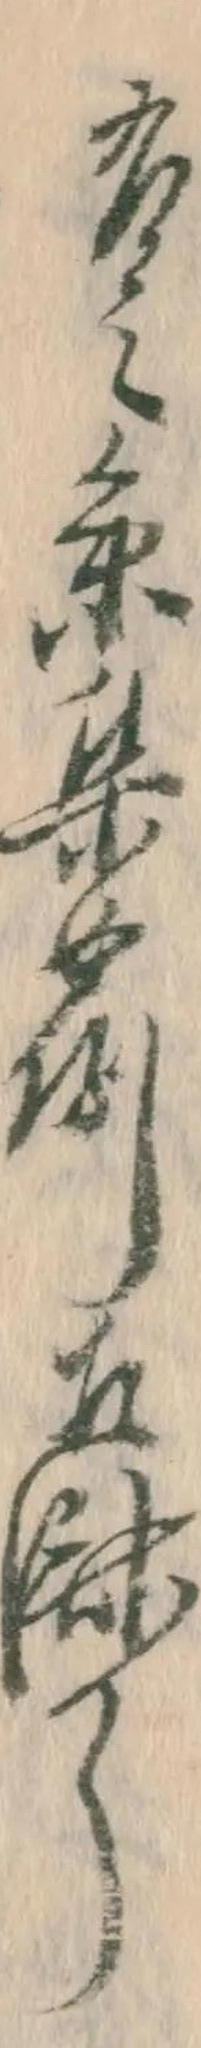有之参集如例相済了
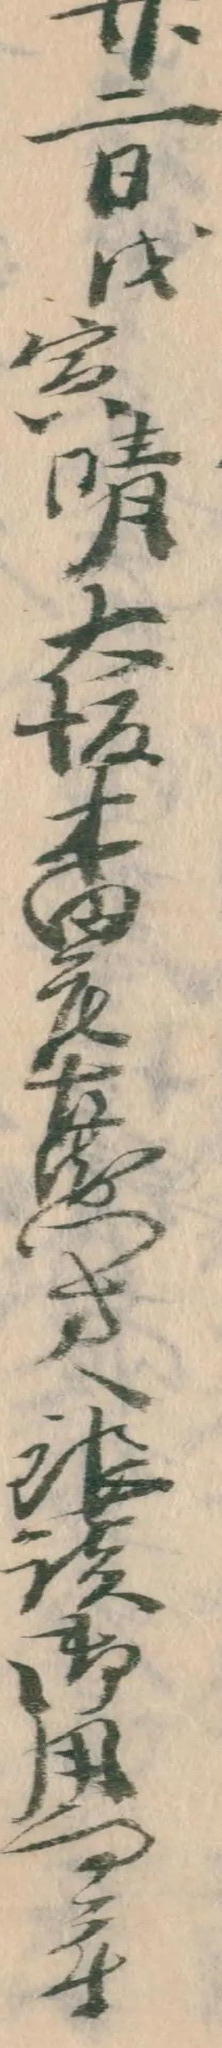廿二日戊寅晴大坂木田茂左衛門方へ銀談御用向ニ付
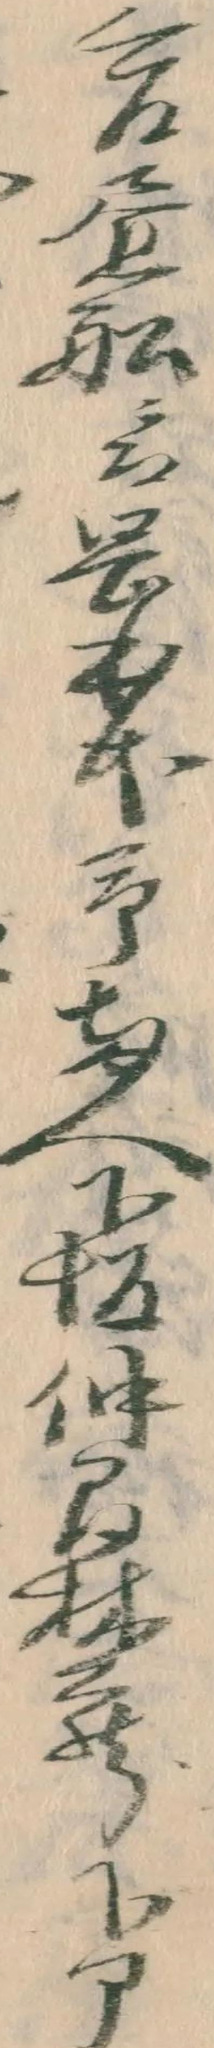今日昼舩ニ而岡本本予両人下坂仲間林蔵下部
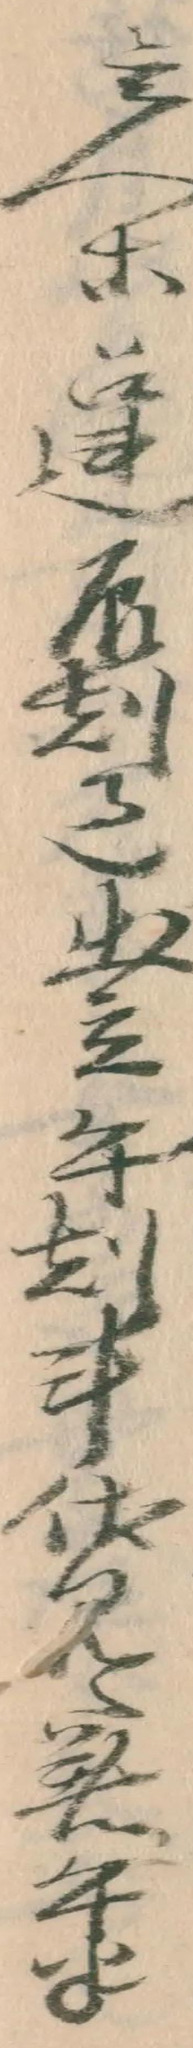壱人等召連辰刻過出立午刻斗伏見へ着午半
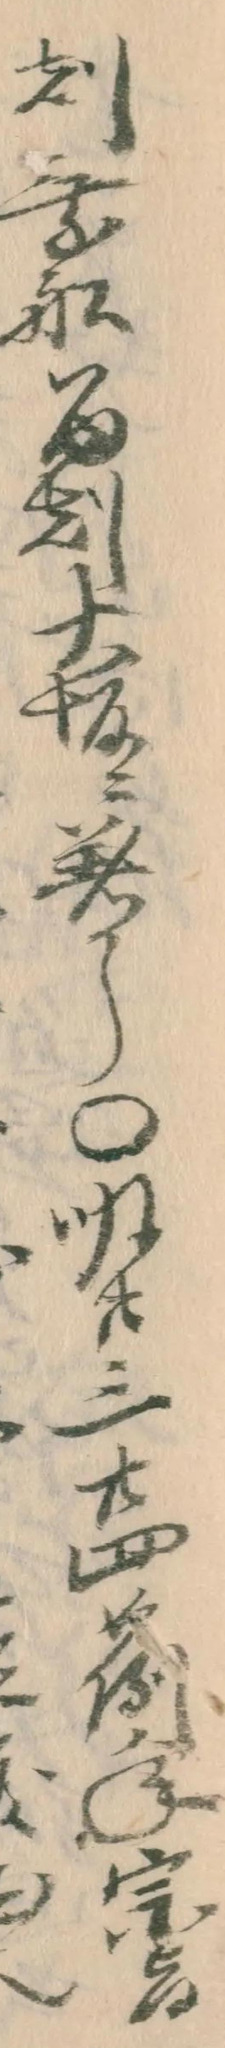刻乗舩酉刻大坂二著了○明廿三廿四如例年宗旨
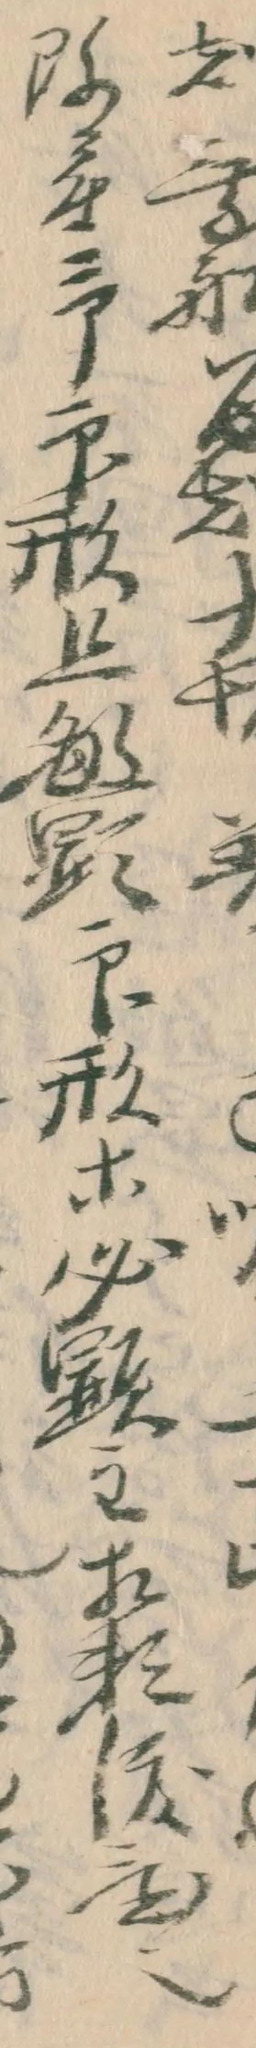改ニ付予印形且敏顕印形等必顕主相頼渡置也
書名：賀茂社記録. 第67冊
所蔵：国立国会図書館 National Diet Library, JAPAN
